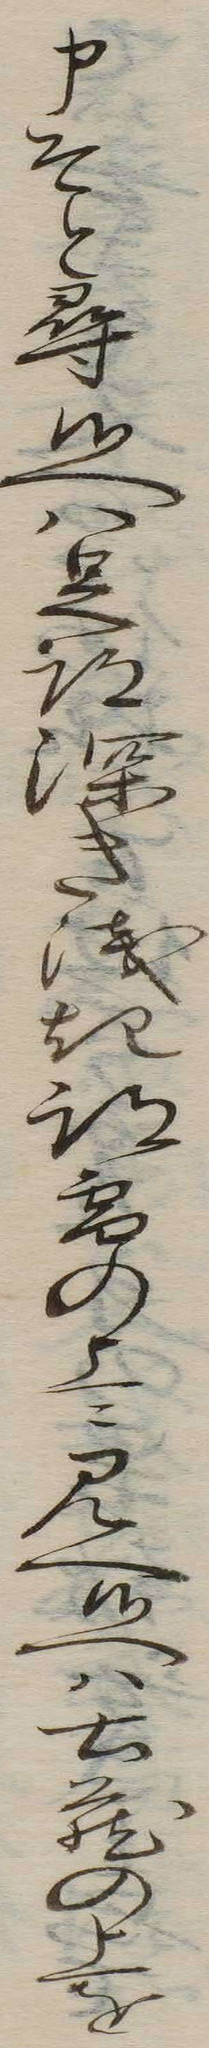申そと尋候へは足跡深き浅き跡雪の上ニ見へ候へは土蔵の上を
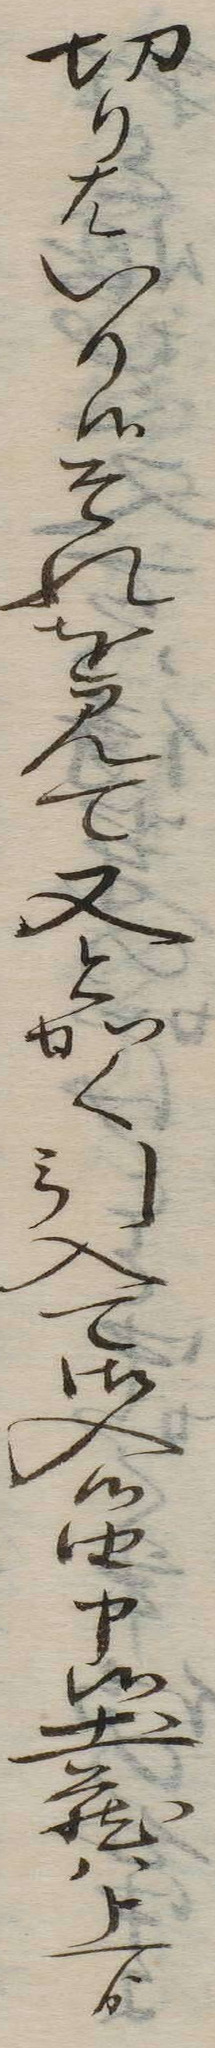切りはいり候それを見て又とかく引入て御入候由申候土蔵は上ゟ
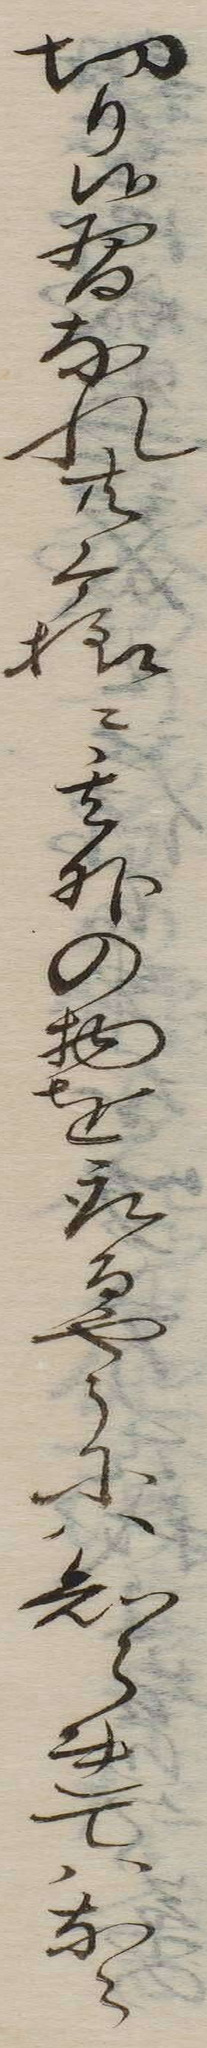切り候習なれ共ケ様ニ其外の物を取るやうには知られてはなら
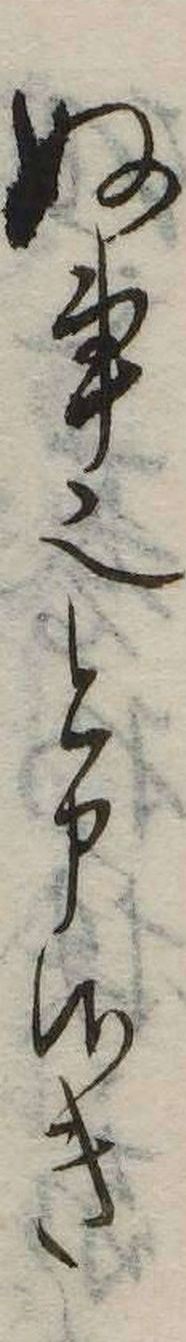ぬ事也と申候き
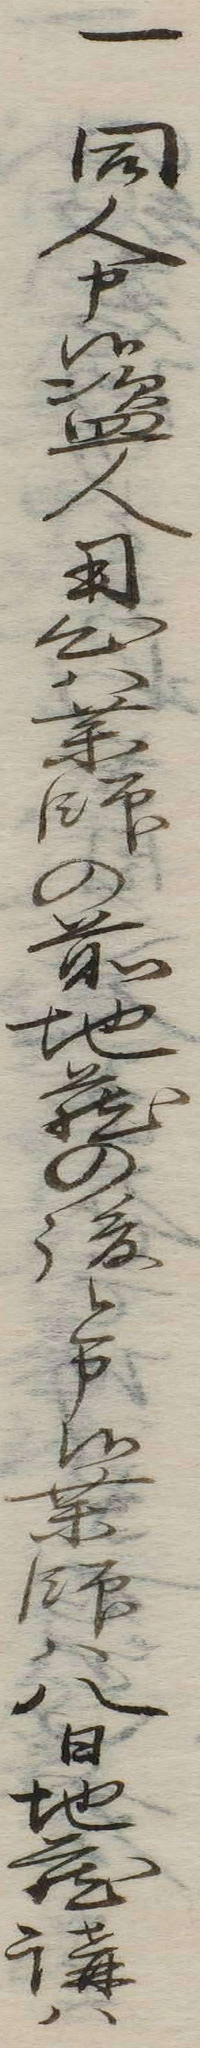一同人申候盗人用心は薬師の前地蔵の後と申候薬師は八日地蔵講は
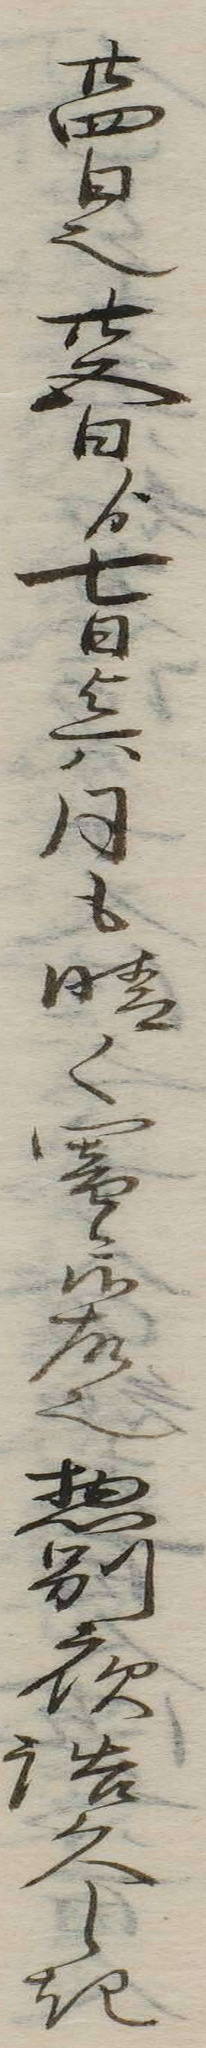廿四日也廿五日ゟ七日迄は月も暗く闇に候故也惣別夜詰久しき
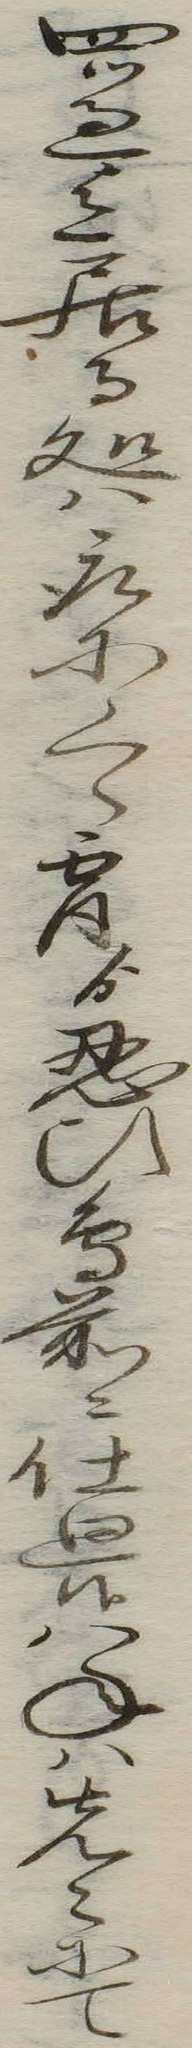四ツ過迄居る処は取にくゝ宵ゟ忍ひ鳥前ニ仕廻候はねは先々にて
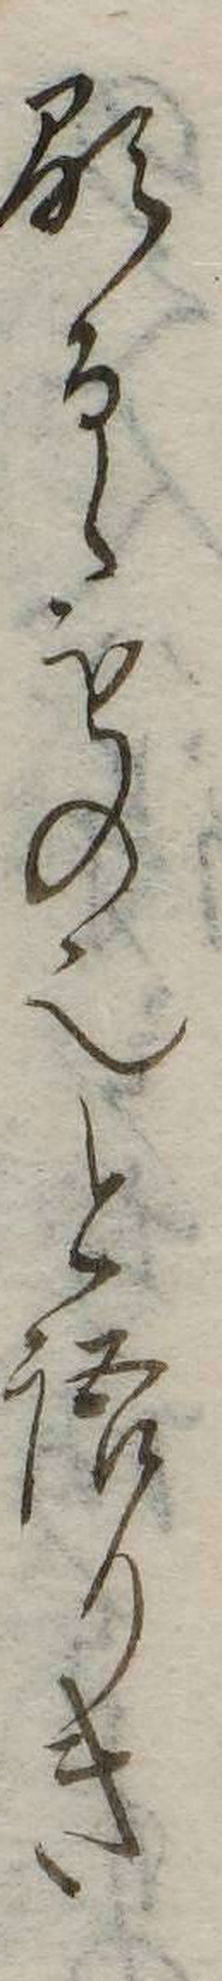顕るゝもの也と語りき
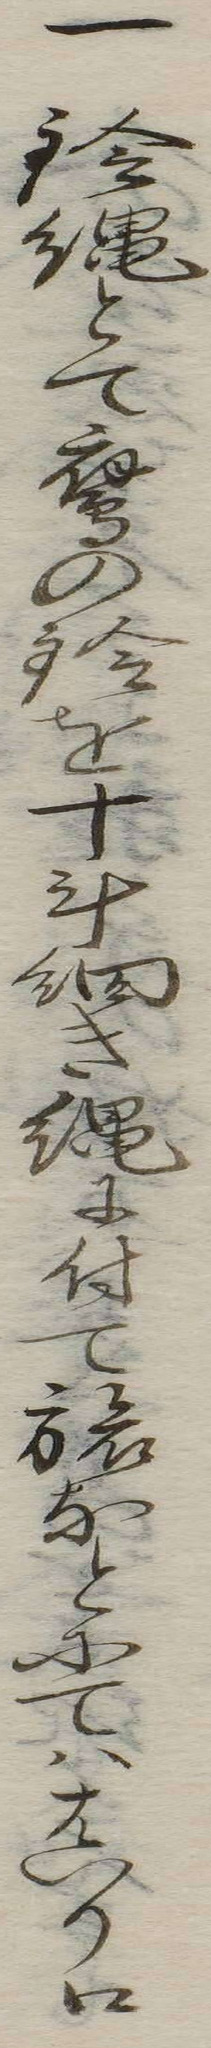一鈴縄とて鷹の鈴を十斗細き縄に付て旅なとにてははいり口
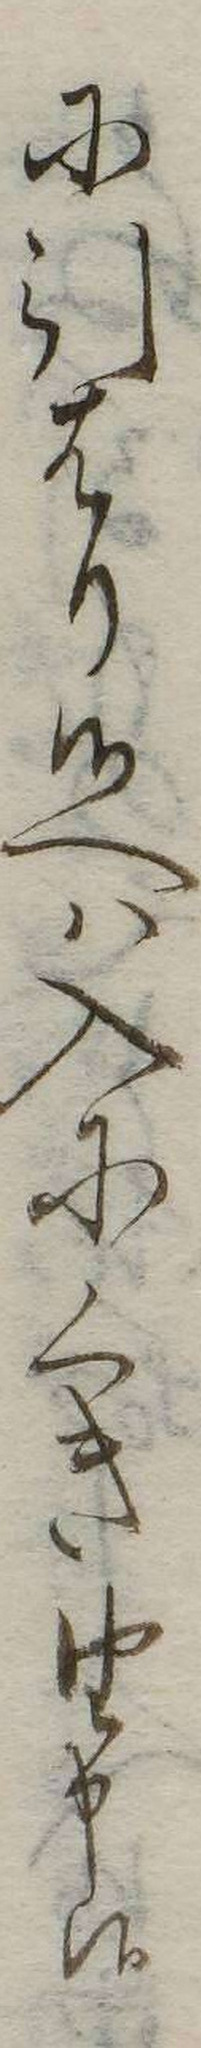に引はり候へは入にくき由申候
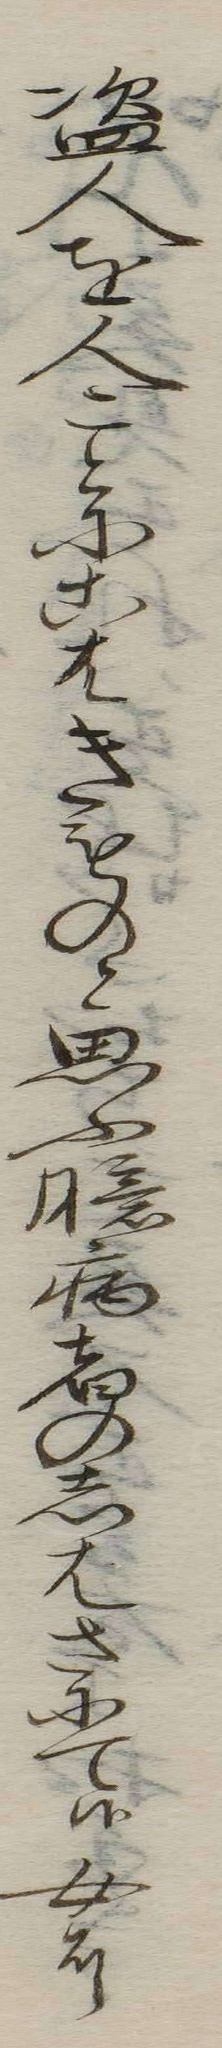一盗人を人ことにこはきものと思ふ臆病者のしはさにて候女に
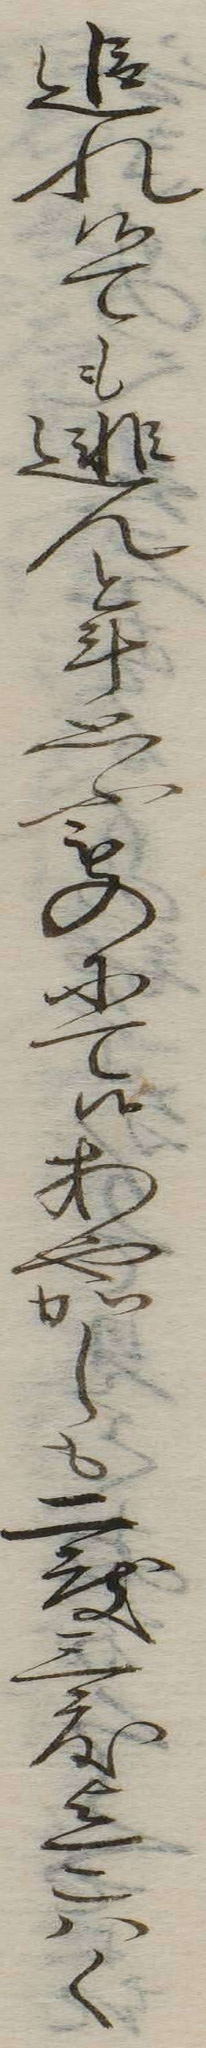追れ候ても逃んと斗思ふものにて候あやかしも二度三度迄こはく
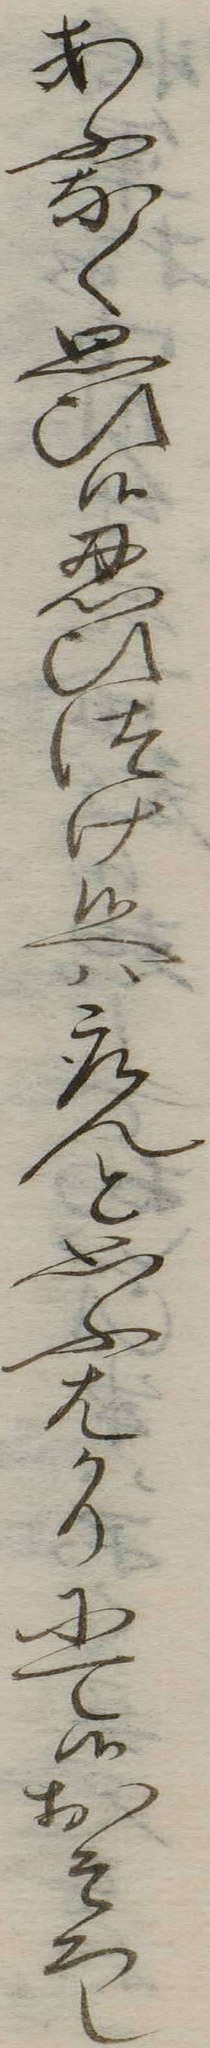あふなく思ひ候忍ひつけ候へは取んと思ふはかりにて候おそろし
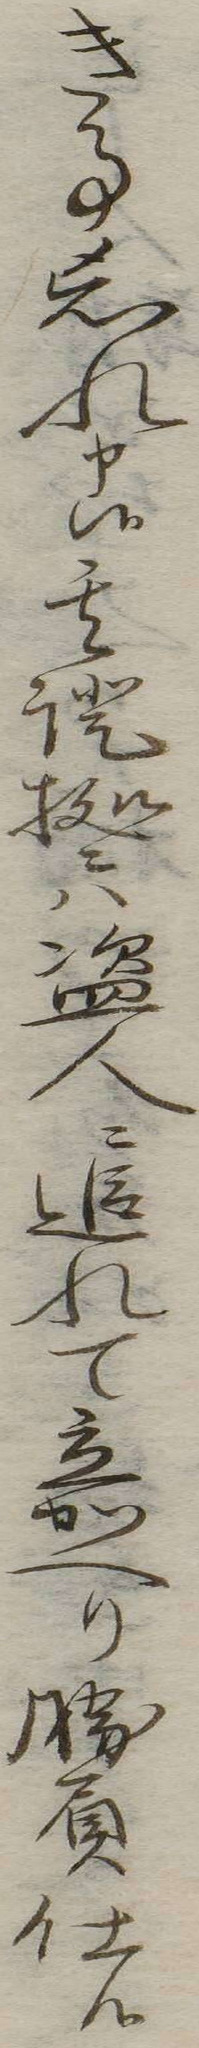き事忘れ申候其証拠ニハ盗人ニ追れて立かへり勝負仕候
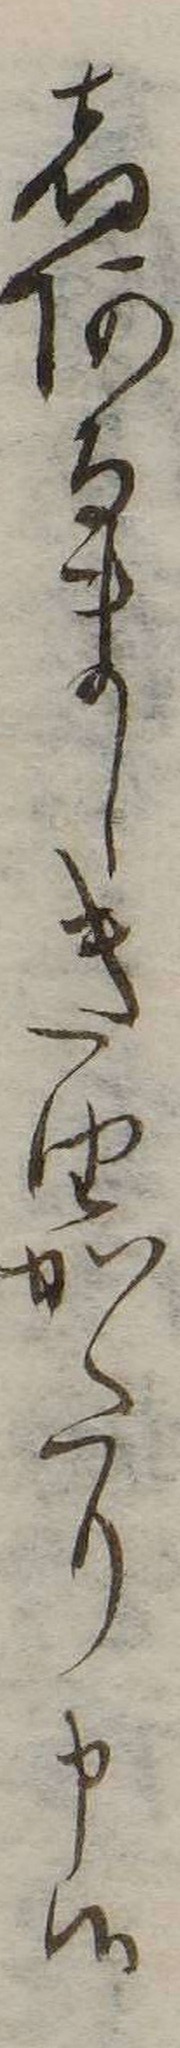志あるましき由かたり申候

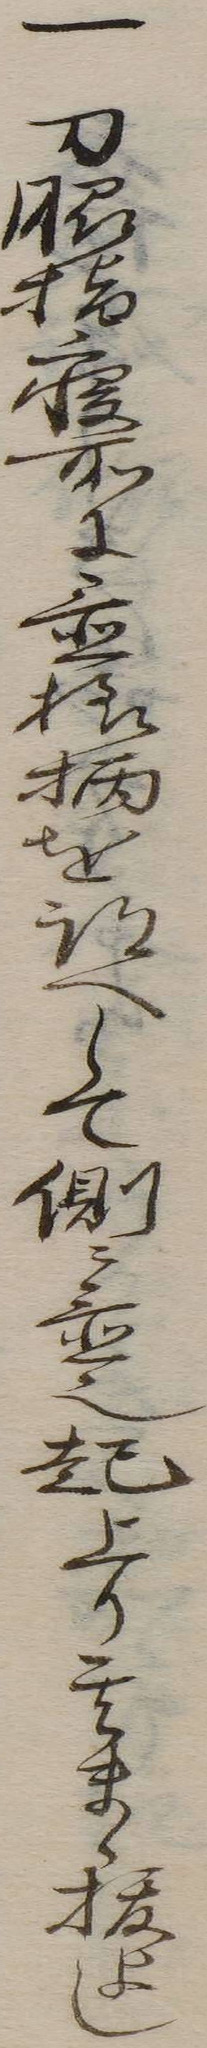一刀脇指寝所に置様柄を跡へして側ニ置也起上り其まゝ抜よし
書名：三河之物語
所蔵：国文学研究資料館
